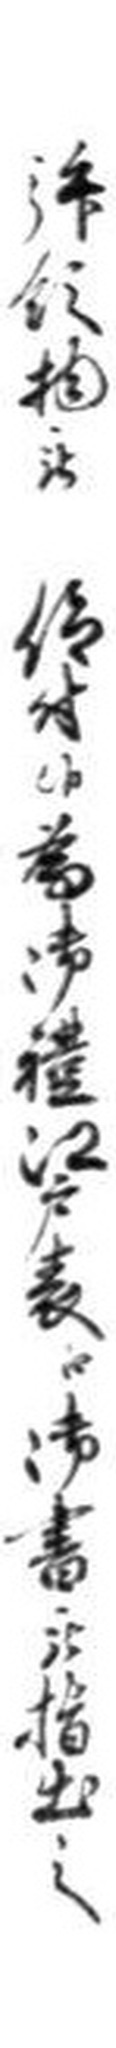拝領物被仰付候為御礼江戸表江御書被指出之
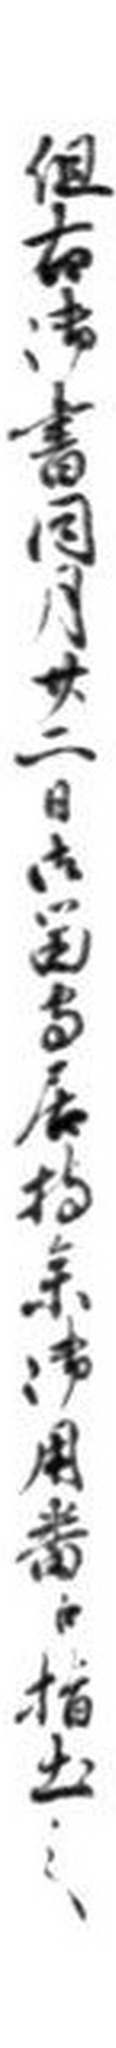但右御書同月廿二日御留守居持参御用番江指出之
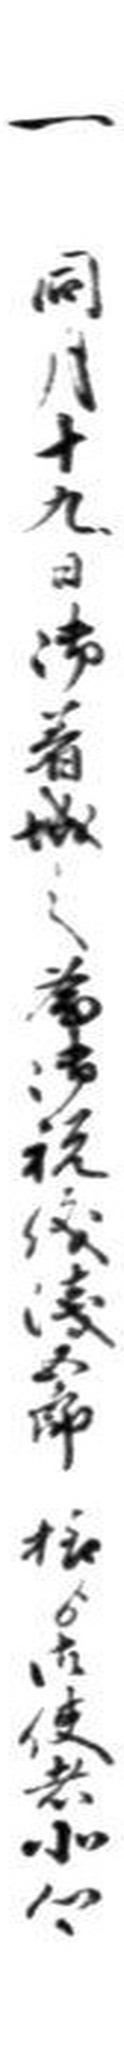一同月十九日御着城之為御祝儀浅五郎様ゟ御使者北郷
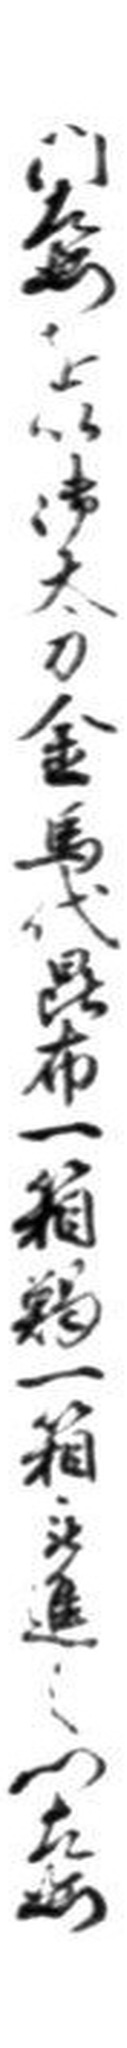門左衛門を以御太刀金馬代昆布一箱鯣一箱被進之門左衛門
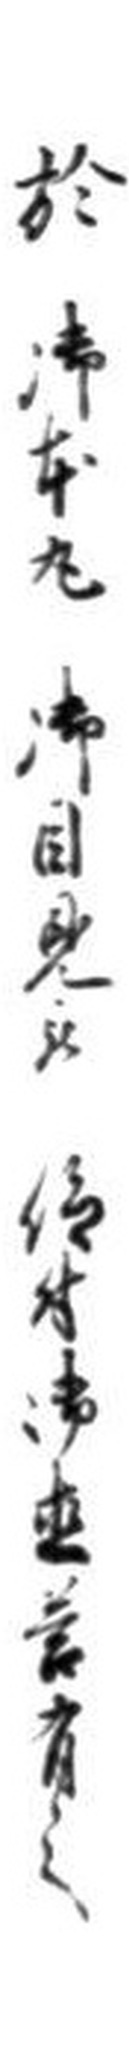於御本丸御目見被仰付御直答有之
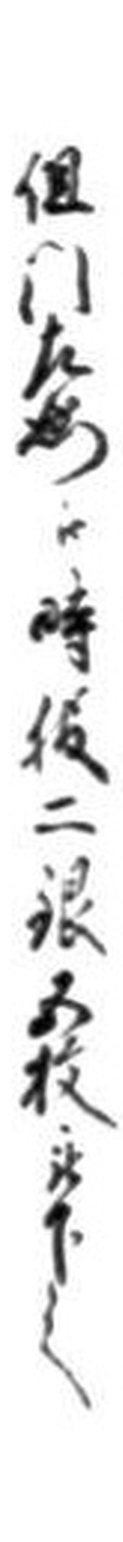但門左衛門江時服二銀五枚被下之
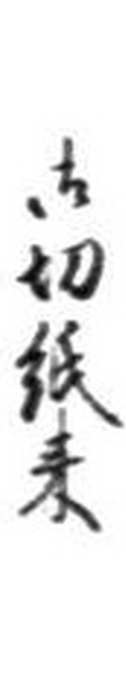御切紙来
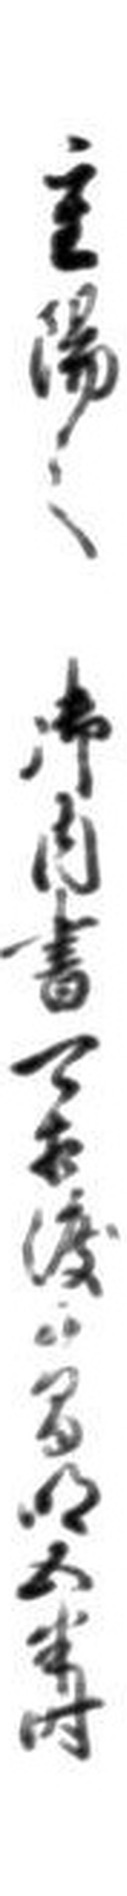重陽之御内書可相渡候間明五半時
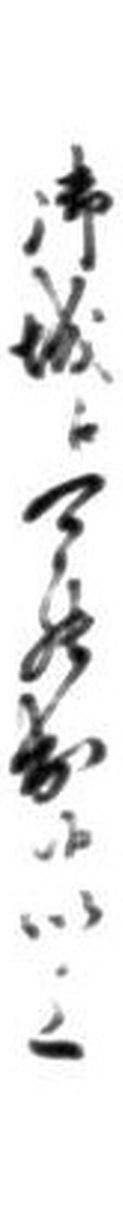御城江可罷出候以上
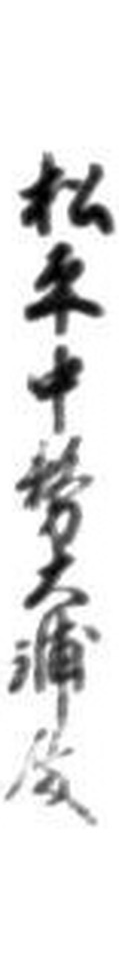松平中務大輔殿
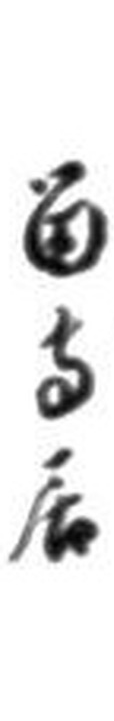留守居
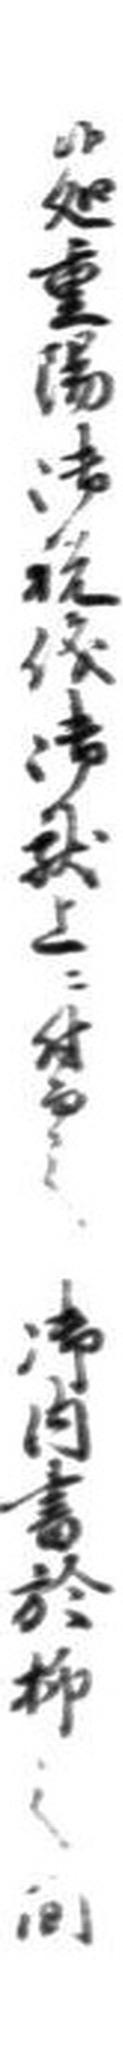候処重陽御祝儀御献上ニ付而之御内書於柳之間

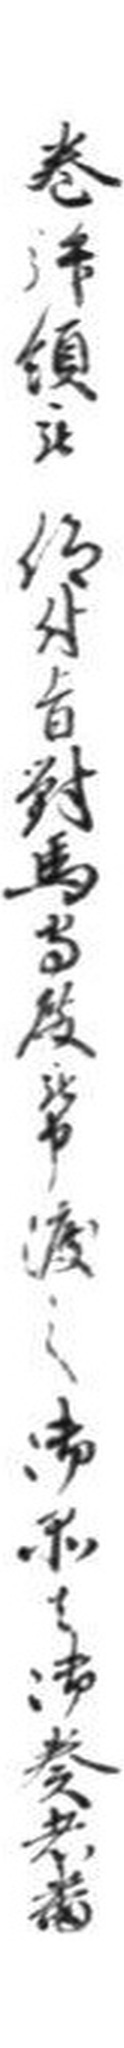巻拝領被仰付旨対馬守殿被申渡之御品者御奏者番
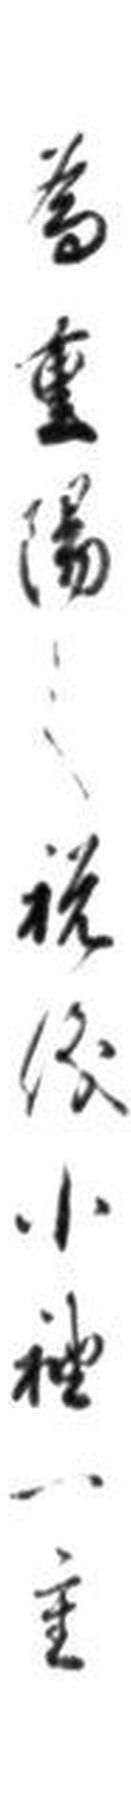為重陽之祝儀小袖一重
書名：家譜 三十五 宗昌公 従享保六年到同七年
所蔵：福井県文書館 Fukui Prefectural Archives
